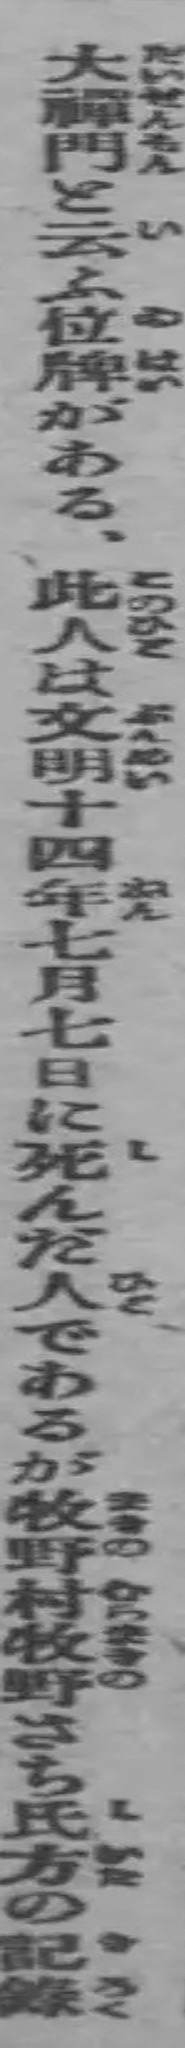大禅門と云ふ位牌がある、此人は文明十四年七月七日に死んだ人であるが牧野村牧野さち氏方の記録
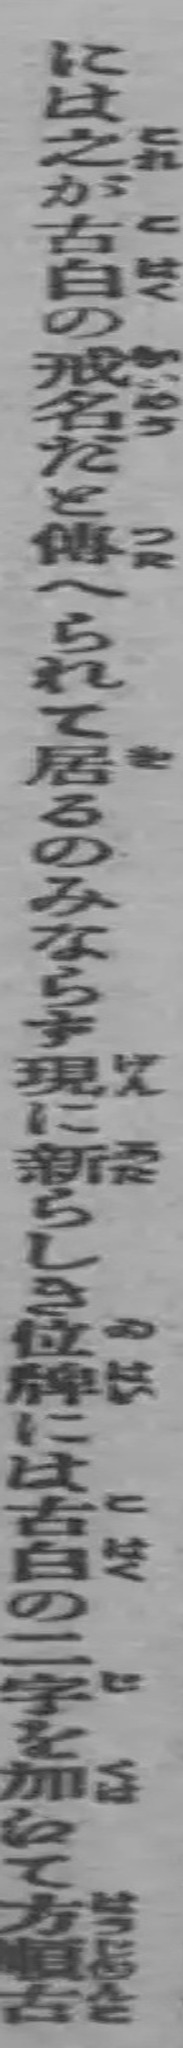には之が古白の戒名だと伝へられて居るのみならず現に新らしき位牌には古白の二字を加えて方順古
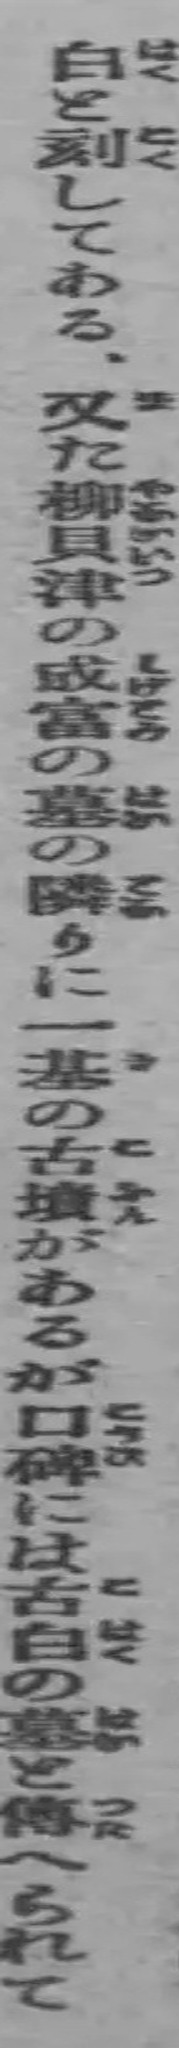白と刻してある、又た柳貝津の成富の墓の隣りに一基の古墳があるが口碑には古白の墓と伝へられて
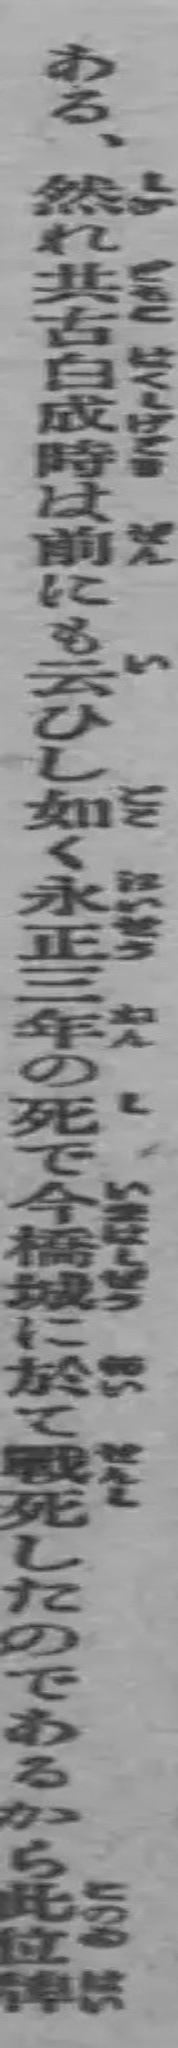ある、然れ共古白成時は前にも云ひし如く永正三年の死で今橋城に於て戦死したのであるから此位牌
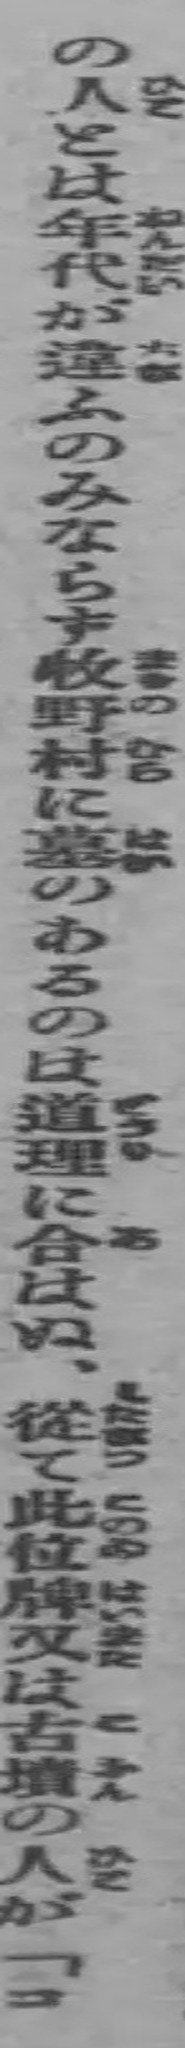の人とは年代が違ふのみならず牧野村に墓のあるのは道理に合はぬ、従て此位牌又は古墳の人が「コ
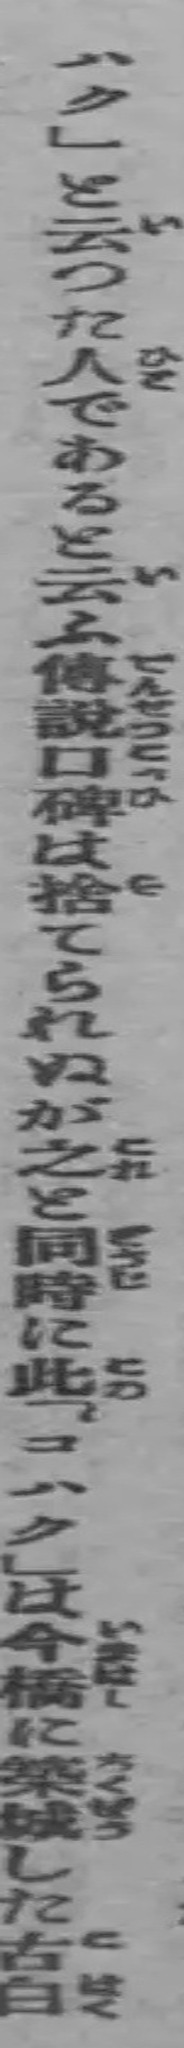ハク」と云つた人であると云ふ伝説口碑は捨てられぬが之と同時に此「コハク」は今橋に築城した古白
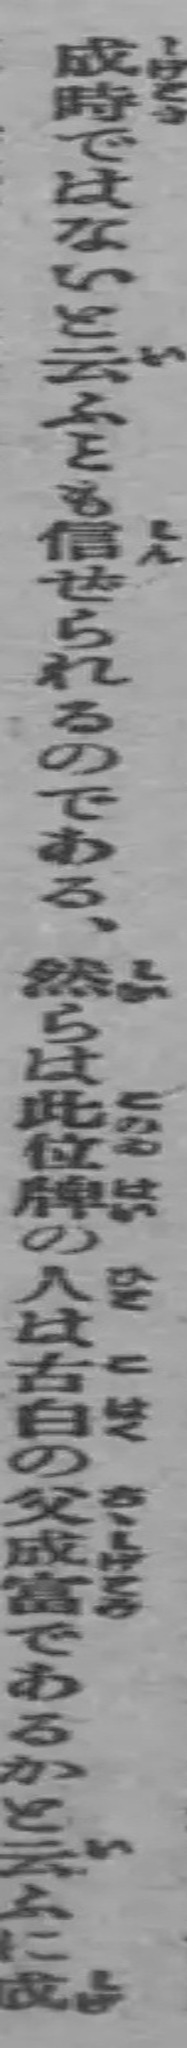成時ではないと云ふことも信ぜられるのである、然らは此位牌の人は古白の父成冨であるかと云ふに成
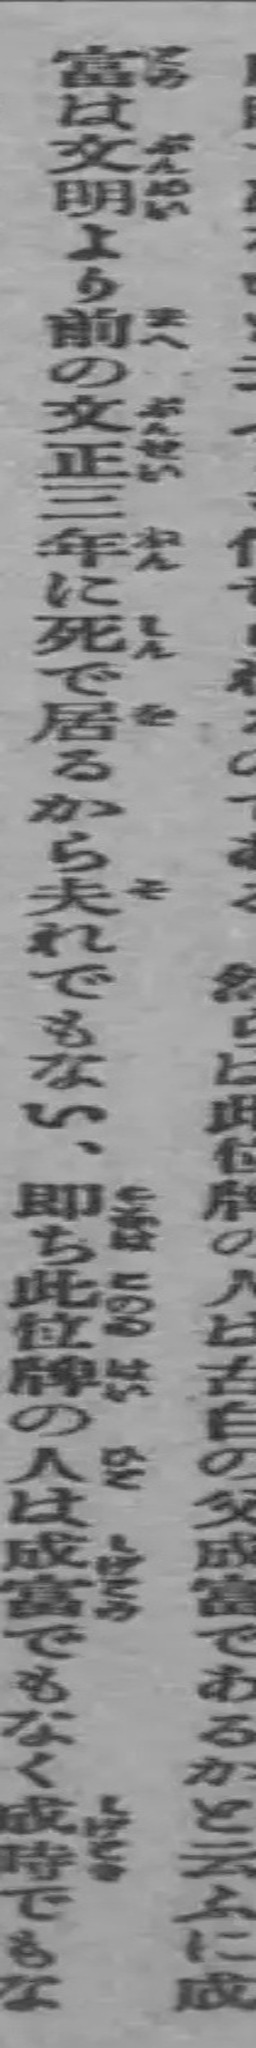冨は文明より前の文正三年に死で居るから夫れでもない、即ち此位牌の人は成冨でもなく成時でもな
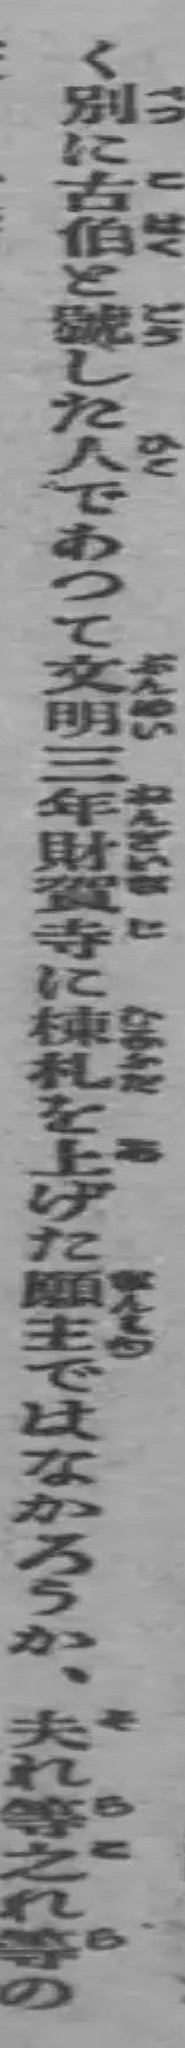く別に古伯と号した人であつて文明三年財賀寺に棟札を上げた願主ではなかろうか、夫れ等こ之れ等の
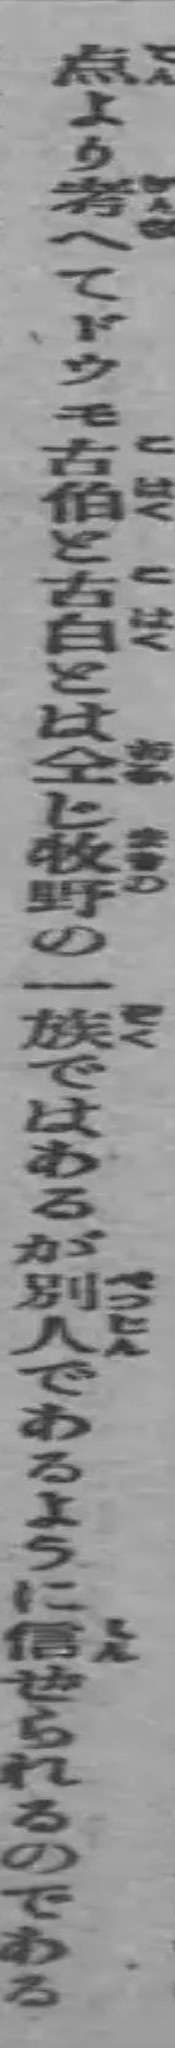点より考へてドウモ古伯と古白とは仝じ牧野の一族ではあるが別人であるように信ぜられるのである
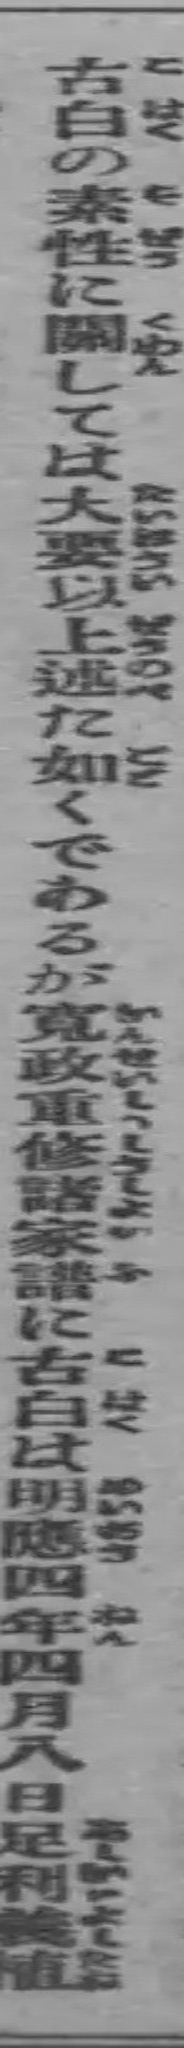古白の素性に関しては大要以上述た如くであるが寛政重修諸家譜に古白は明応四年四月八日足利義稙
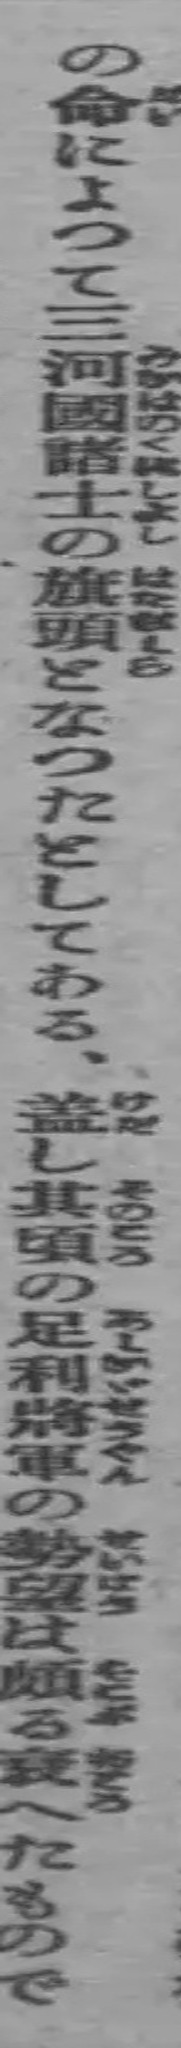の命によつて三河国諸士の旗頭となつたとしてある、蓋し其頃の足利将軍の勢望は頗る衰へたもので
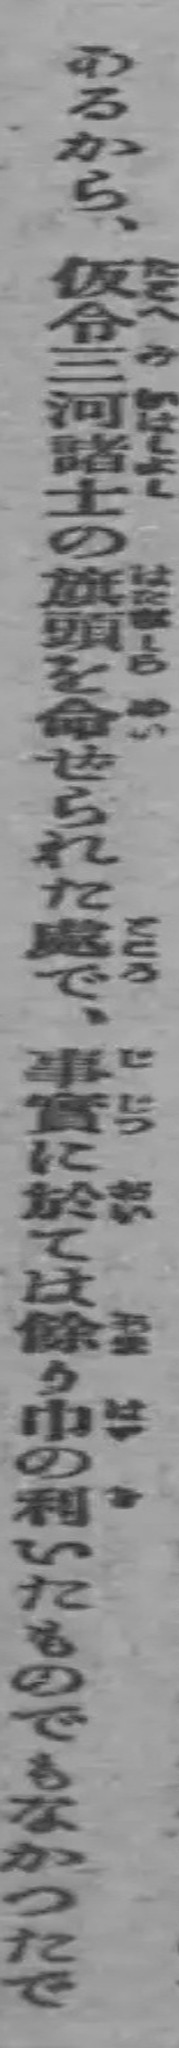あるから、仮令三河諸士の旗頭を命ぜられた処で、事実に於ては余り巾の利いたものでもなかつたで
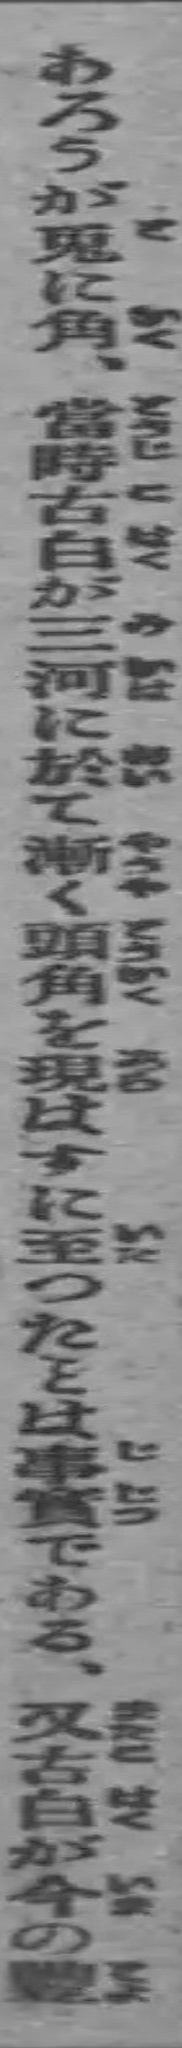あろうが兎に角、当時古白が三河に於て漸く頭角を現はすに至つたことは事実である、又古白が今の豊
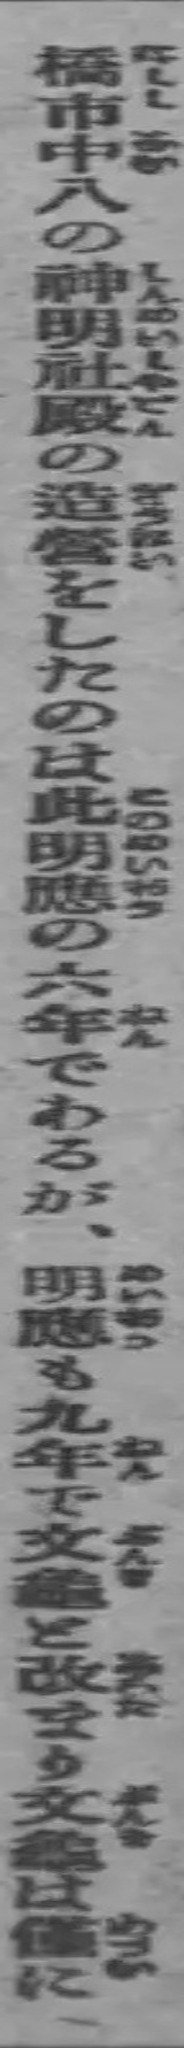橋市中八の神明社殿の造営をしたのは此明応の六年であるが、明応も九年で文亀と改まり文亀は僅に
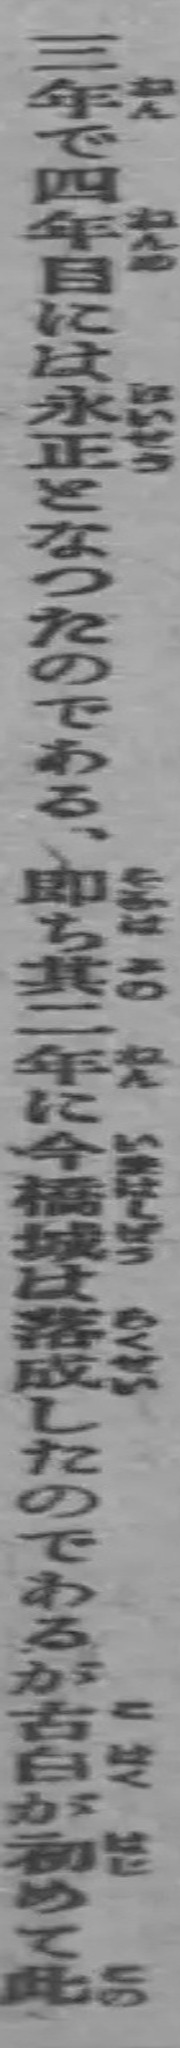三年で四年目には永正となつたのである、即ち其二年に今橋城は落成したのであるが古白が初めて此
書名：豊橋市史談
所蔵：国立国会図書館 National Diet Library, JAPAN
